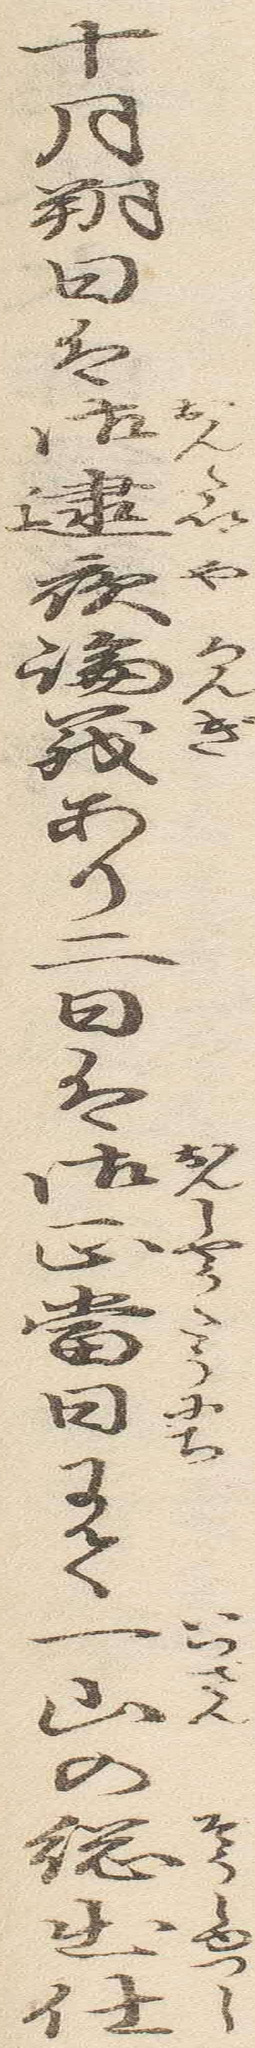十月朔日は御逮夜論議あり二日は御正當日にて一山に総出仕
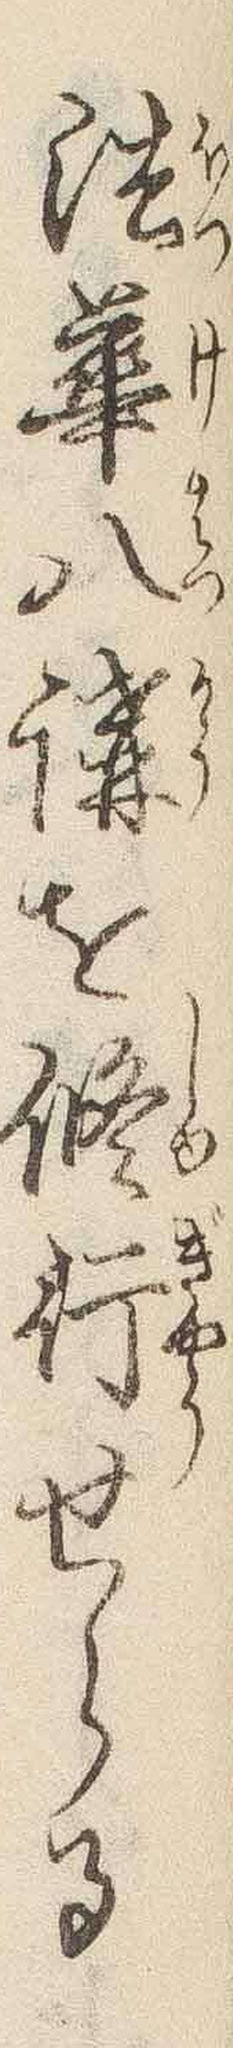法華八講を修行せらる
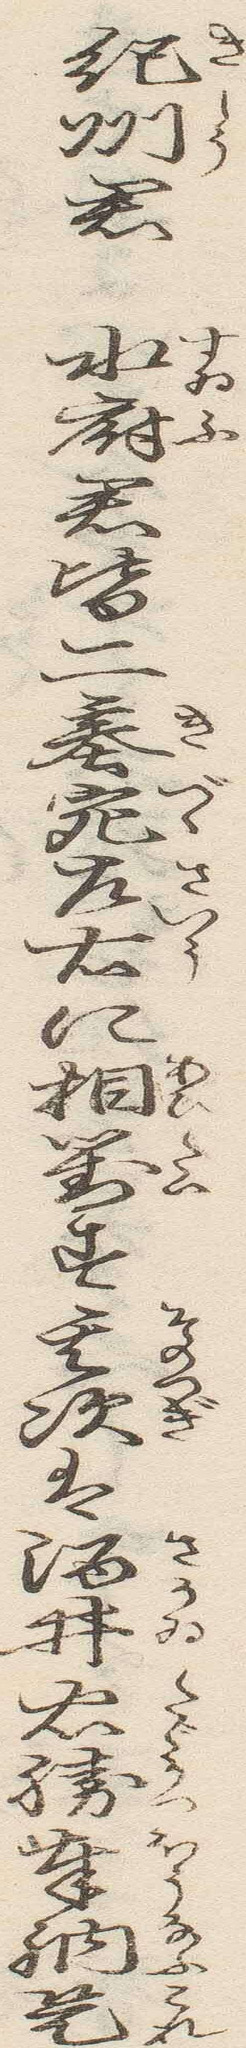紀州君水府君皆二基宛左右に相對す其次は酒井忠勝奉納是
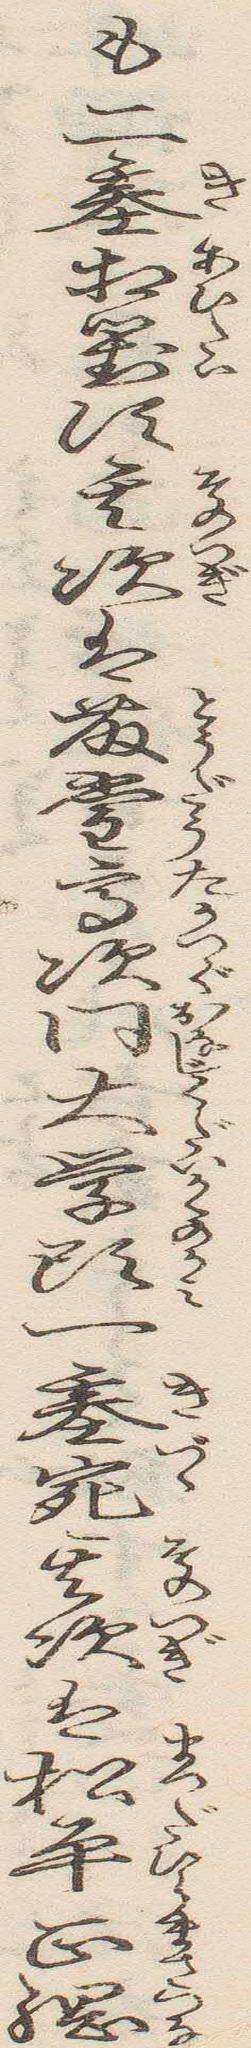も二基相對す其次は藤堂高次同大学頭一基宛其次は松平正綱
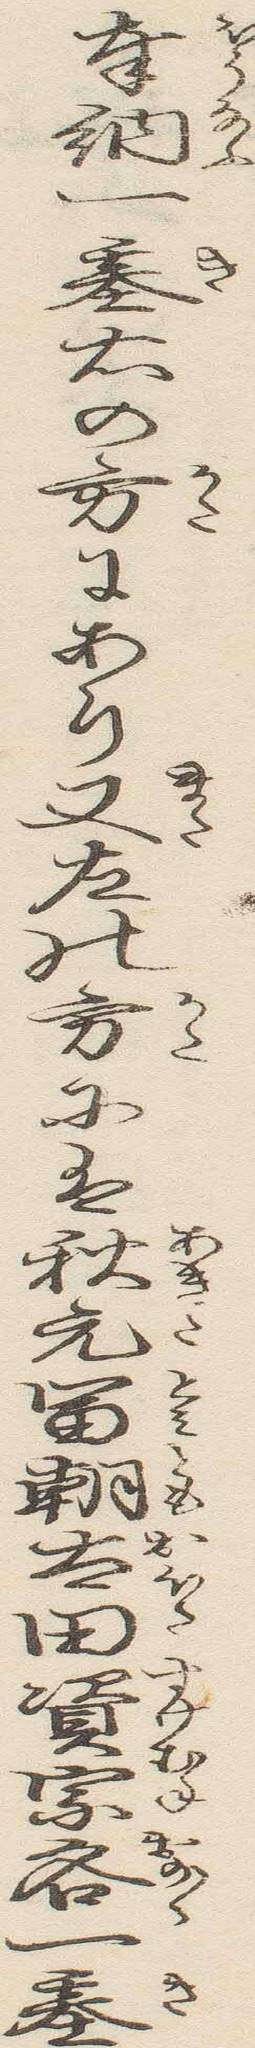奉納一基右の方にあり又左の方には秋元冨朝太田資宗各一基
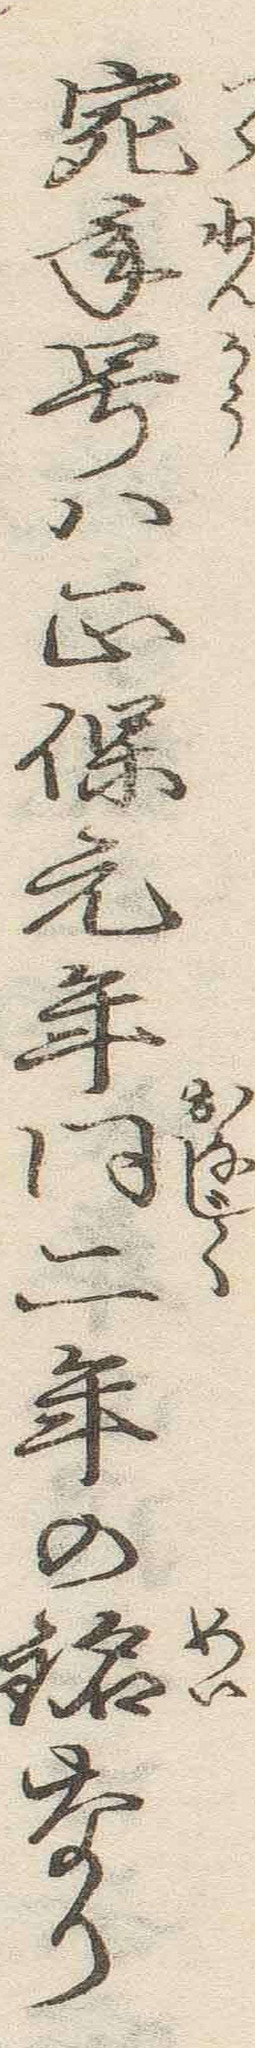宛年号は正保元年同二年の銘なり
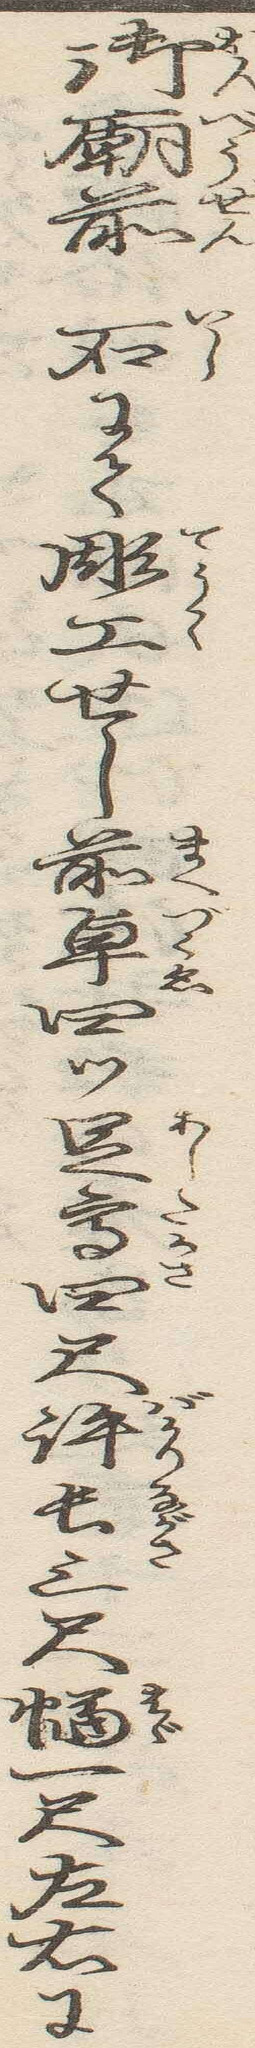御廟前石にて彫工せし前卓四ッ足高四尺許長三尺幅一尺左右に
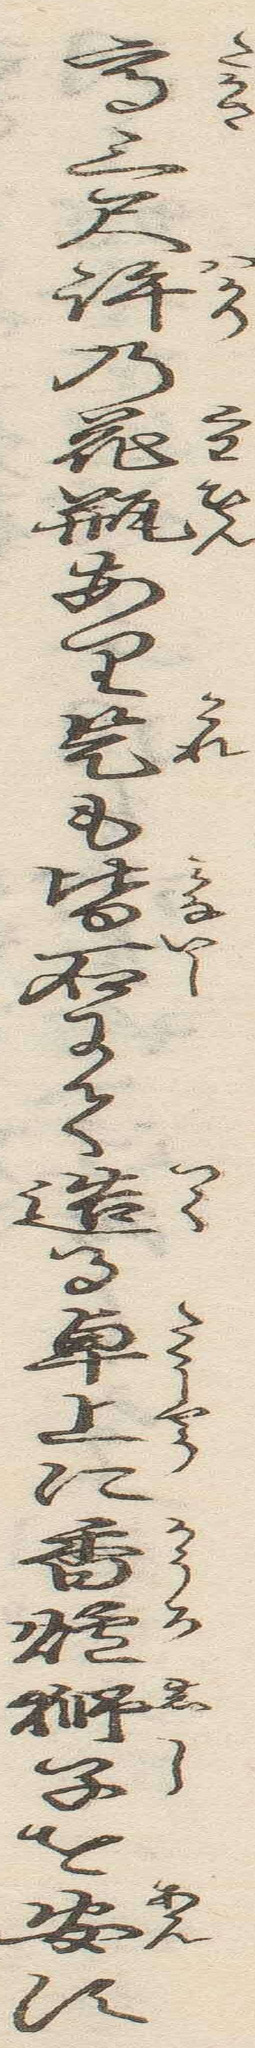高三尺許の花瓶あり是も皆石にて造る卓上に香爐獅子を安す
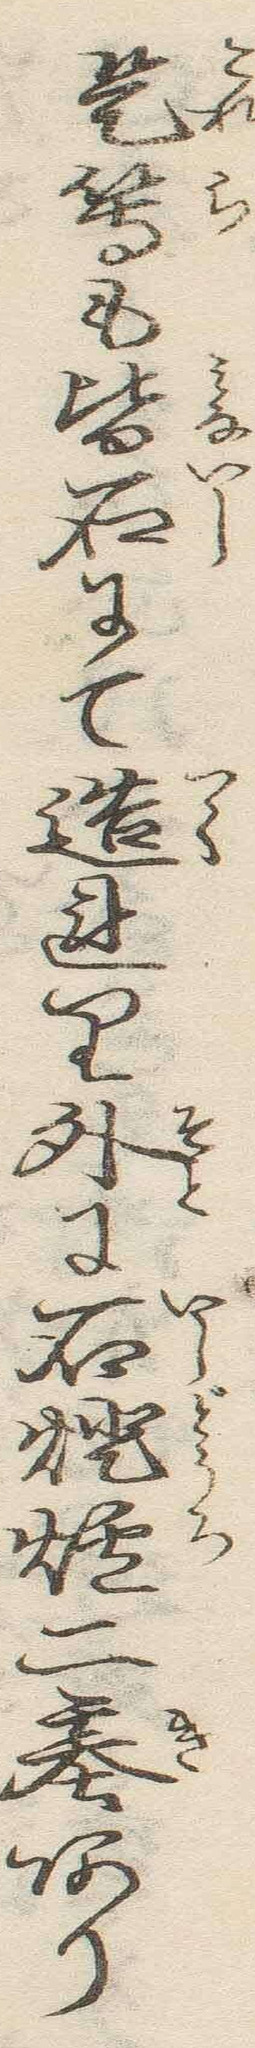是等も皆石にて造れり外は石燈爐二基あり
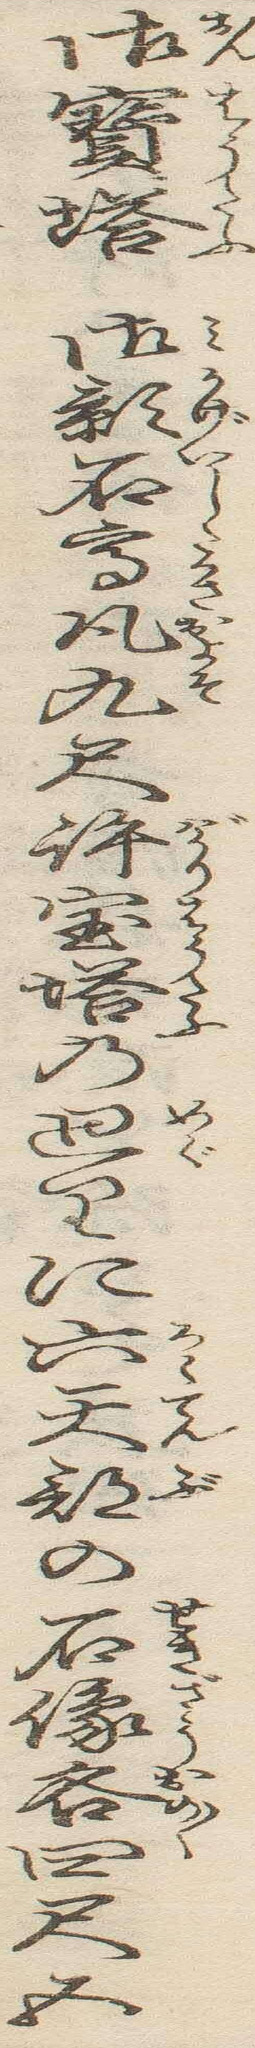御寶塔御影石高凡九尺許宝塔の廻りに六天部の石像各四尺五
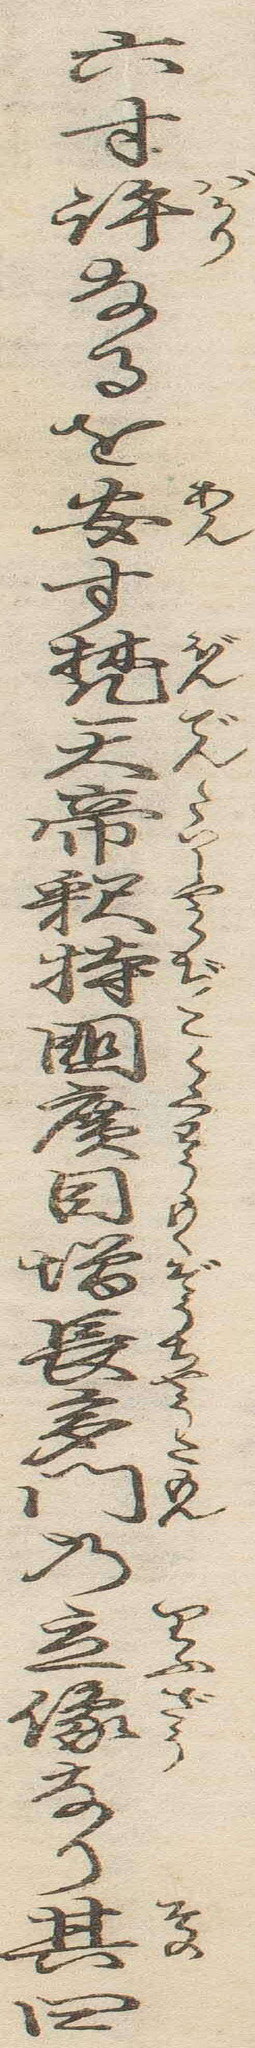六寸許なるを安す梵天帝釈持國廣目増長多門の立像なり其四
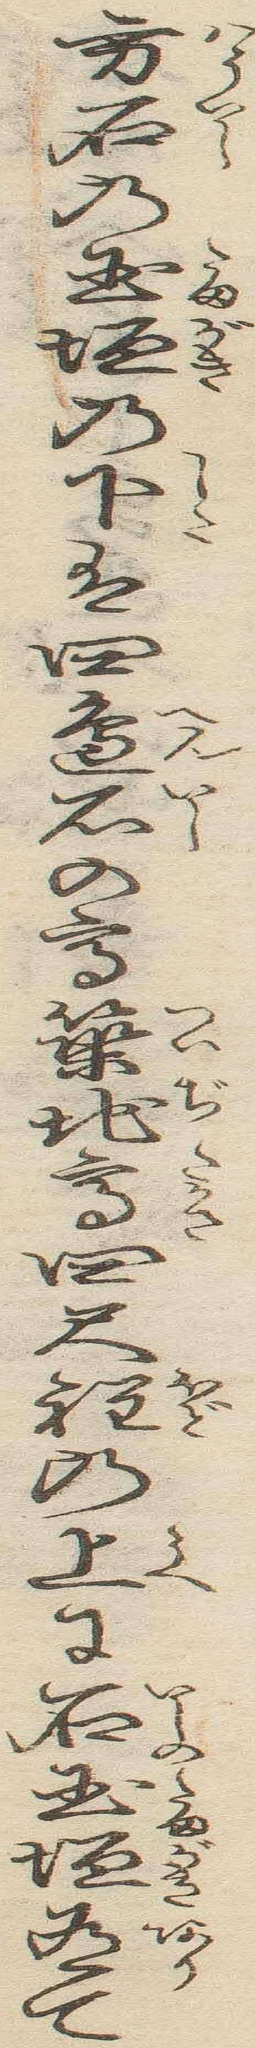方石の玉垣の下は四邊石の高築地高四尺程の上に石玉垣有て

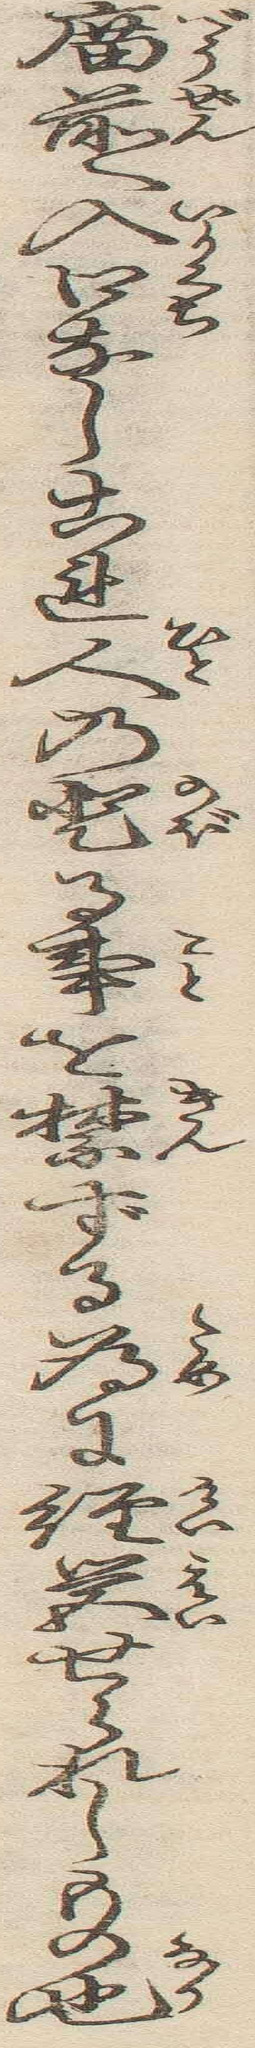庿前へ入口なしこれ人の登る事を禁ずる為に經営せられしもの也
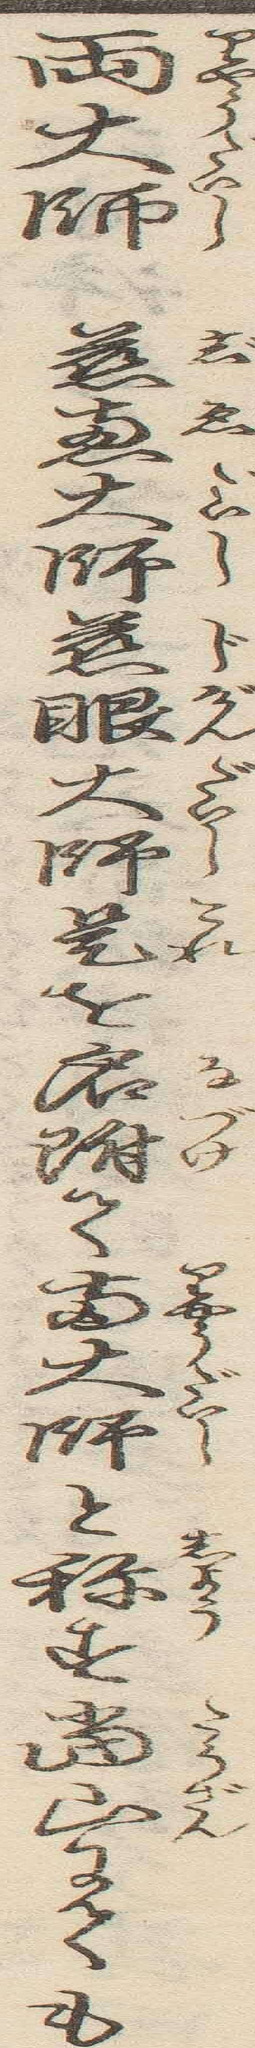両大師慈恵大師慈眼大師是を名附て両大師と称す當山にても
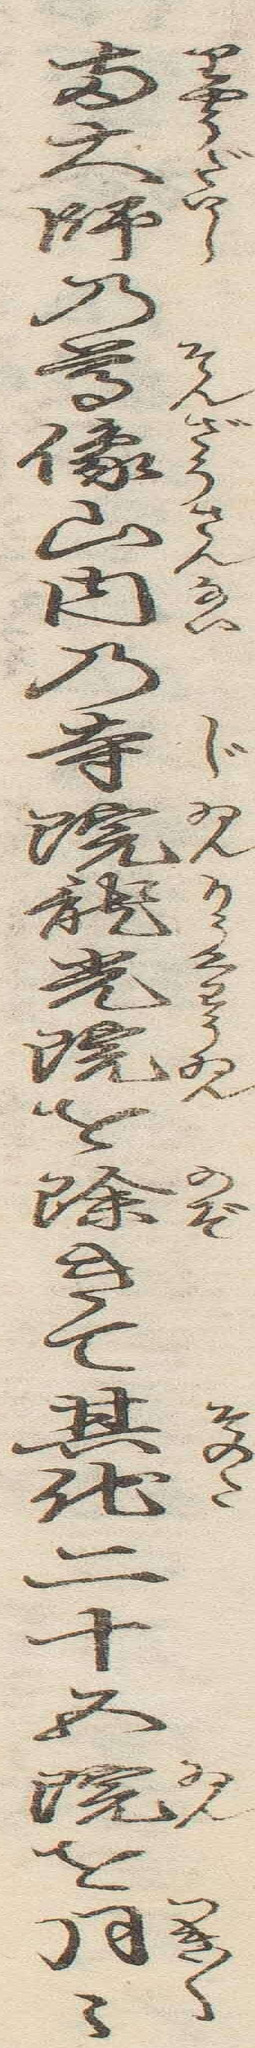両大師の尊像山内の寺院龍光院を除きて其他二十五院を月〻
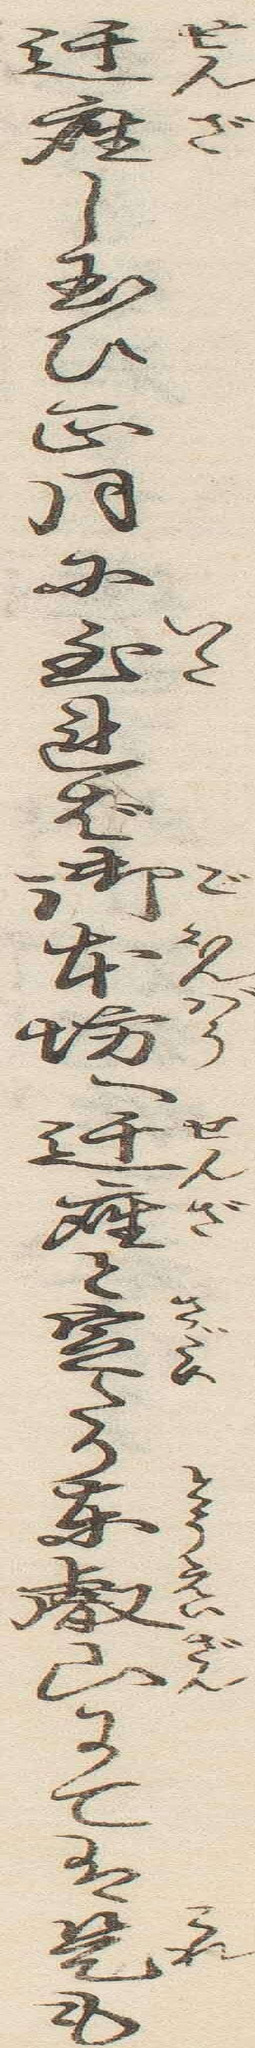迁座し玉ひ正月に至れば御本坊へ迁座と定たり東叡山にては是も
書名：日光山志
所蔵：東京学芸大学附属図書館 国文学研究資料館
